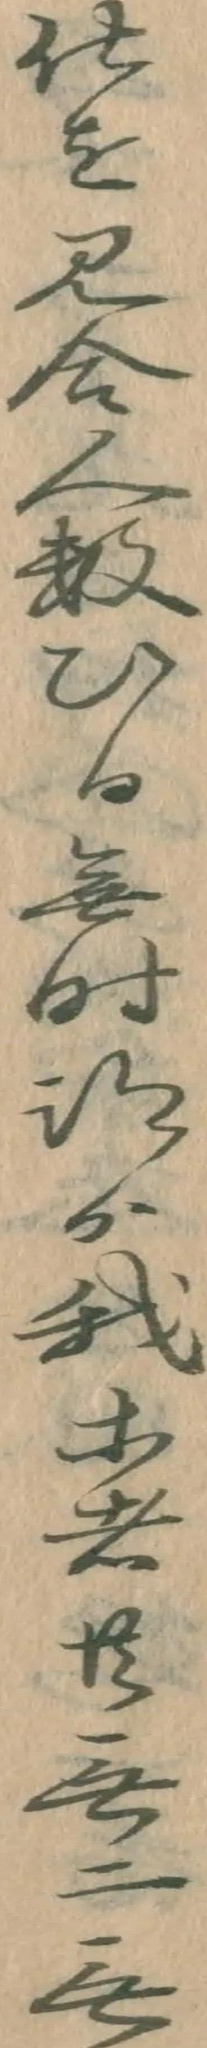仕を見合人数ひる無時跡ゟ我等者共無二無

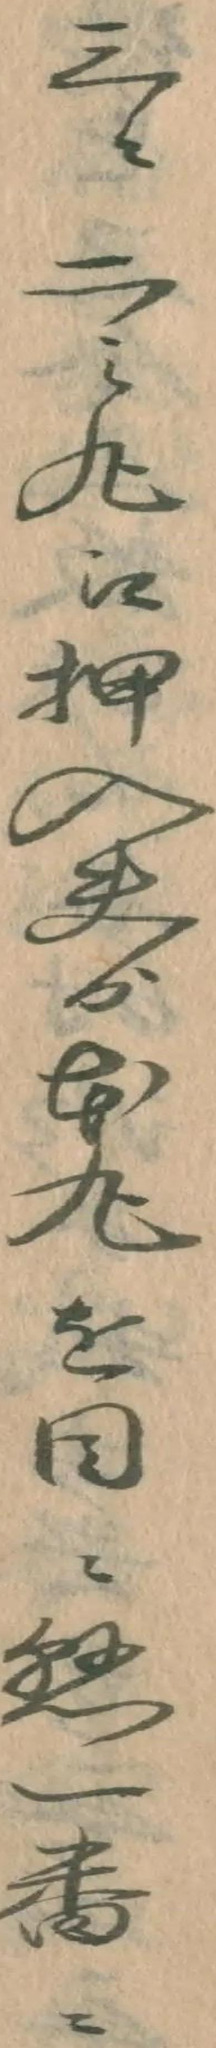三に二之丸江押入夫ゟ本丸を目に懸一番に
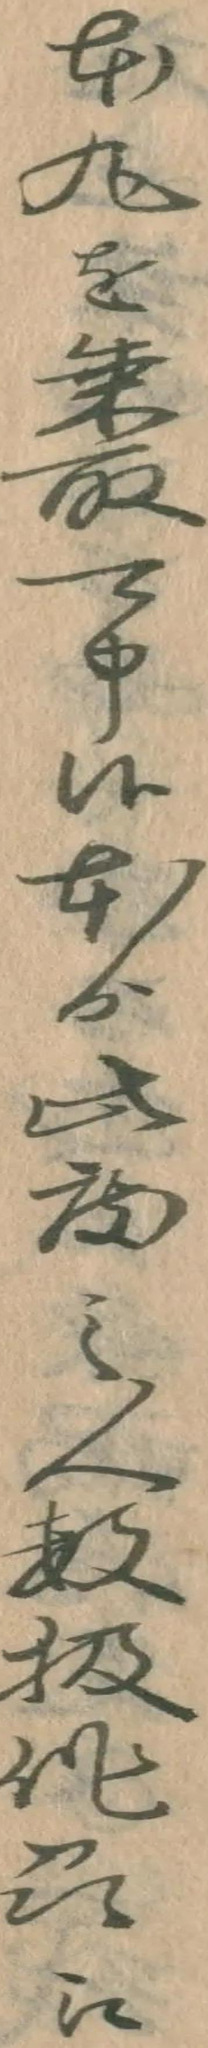本丸を乗取可申候本ゟ此度之人数扱作州江
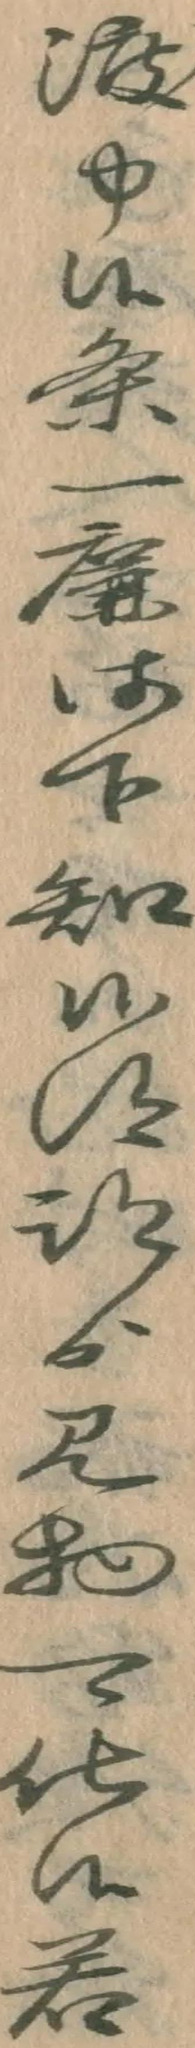渡申候条一廉御下知候得跡ゟ見物可仕候若
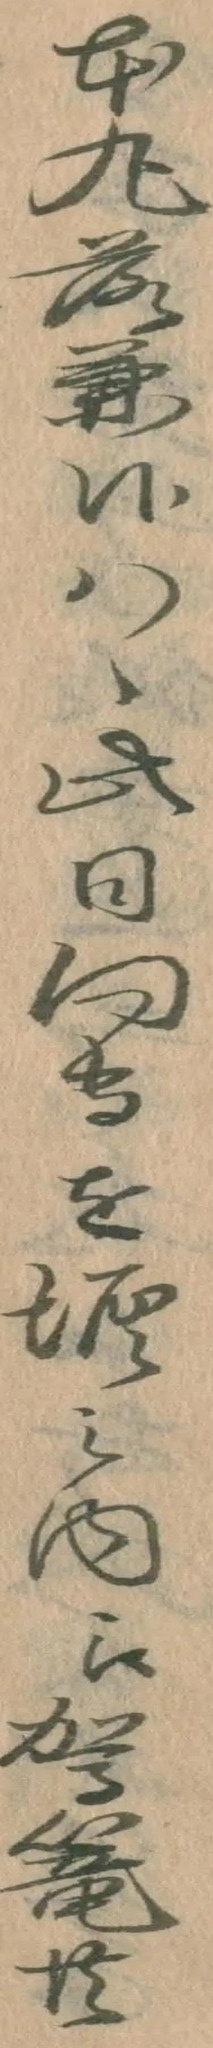本丸落兼候はゝ此日向守を堀之内江駕籠共
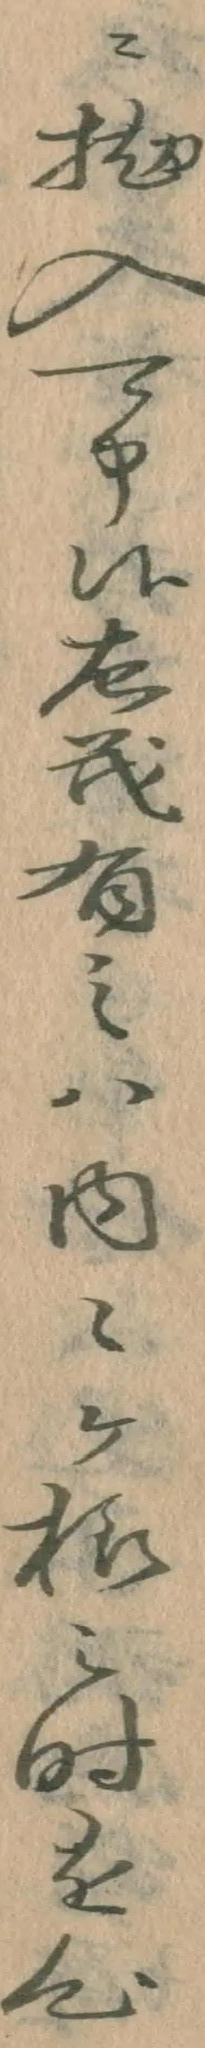に抛入可申候左茂有之は内にけ様に時を心
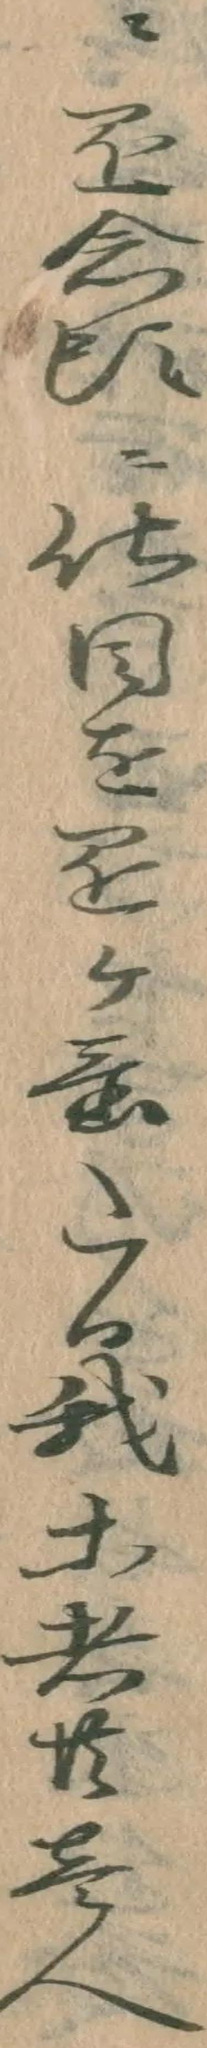に懸念頭に仕目を懸け置たる我等者共壱人
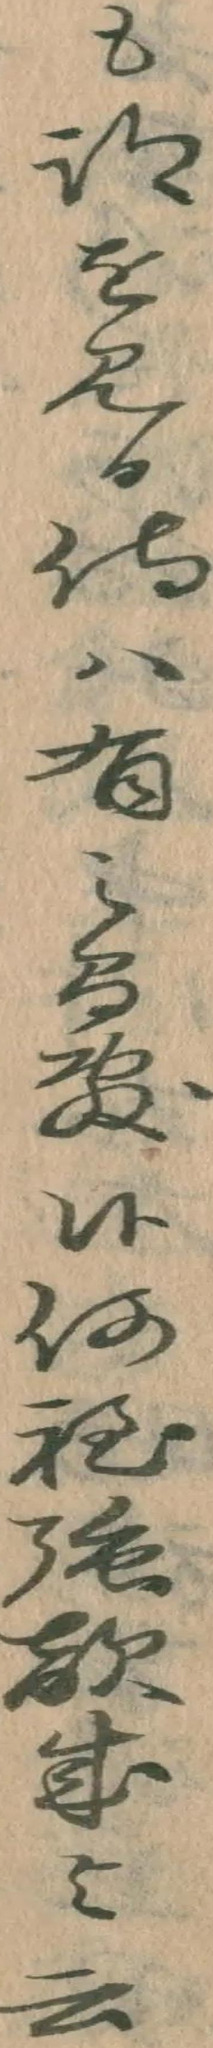も跡を見る侍は有之間敷候何程強敵成与云
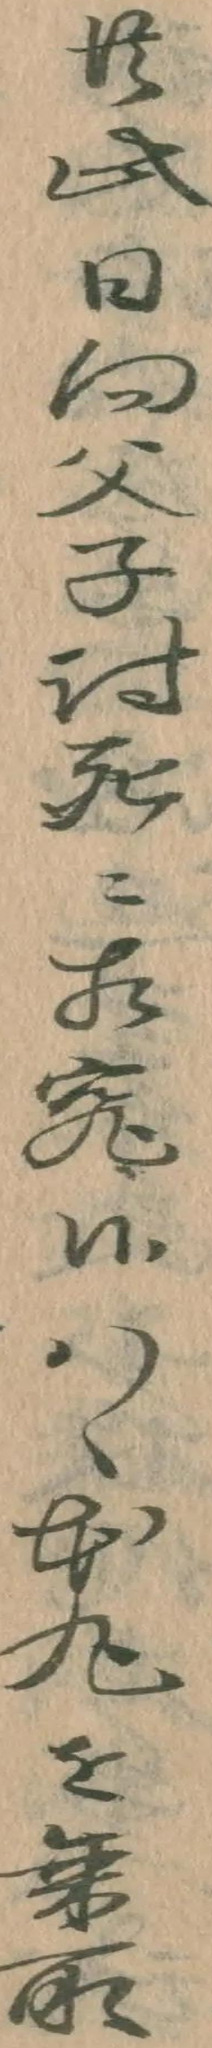共此日向父子討死に相究候はゝ本丸を乗取
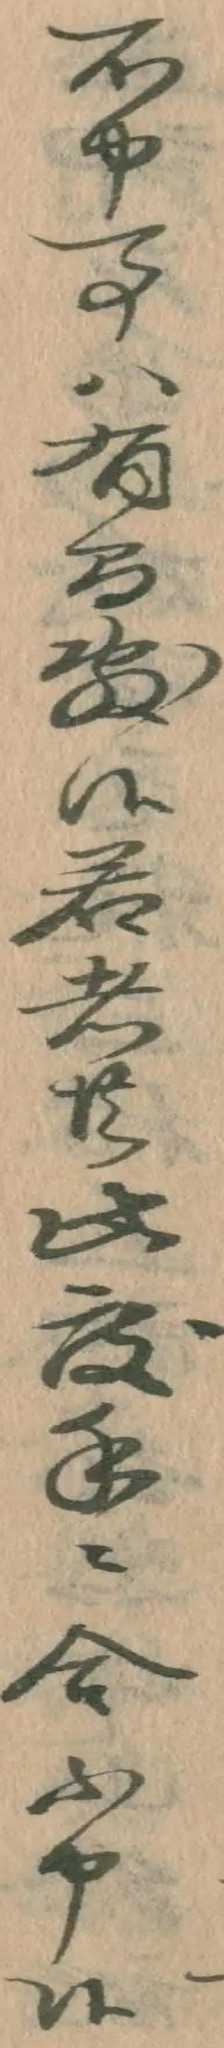不申事は有間敷候若者共此度手に合ふ申候
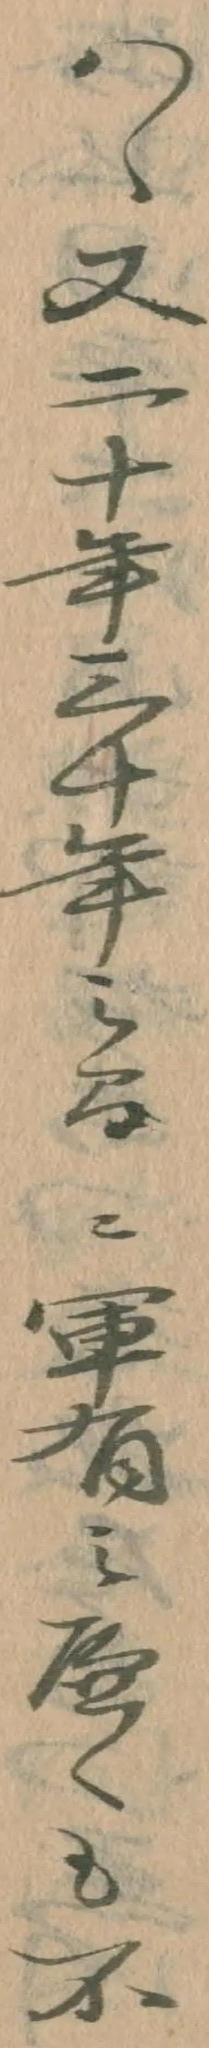はゝ又二十年三十年之間に軍有之扁くも不
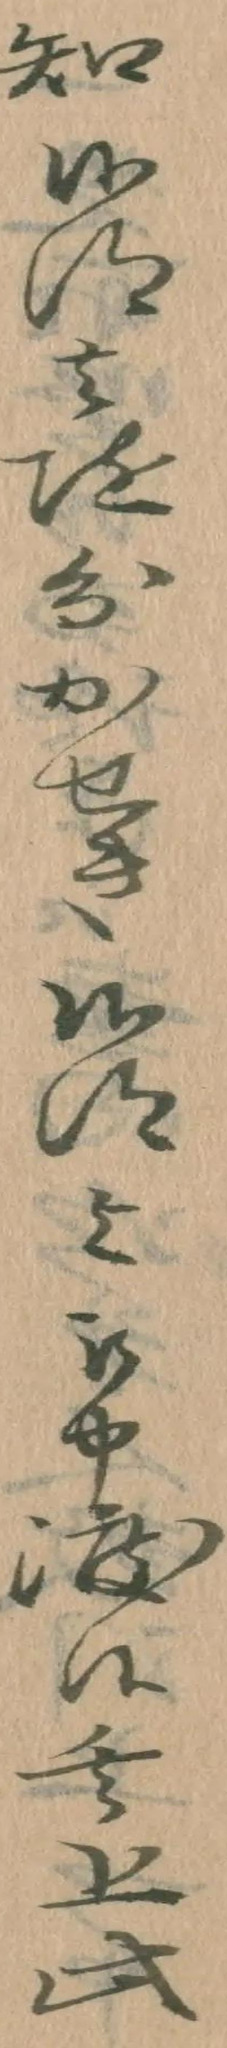知候得者随分かせき候得者被申渡候其上此
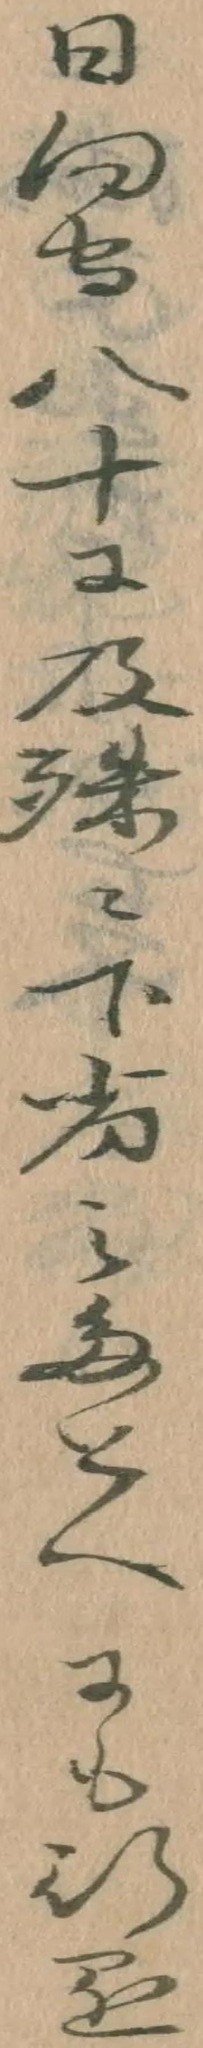日向守八十尓及殊に下劣之多とへ尓も行進
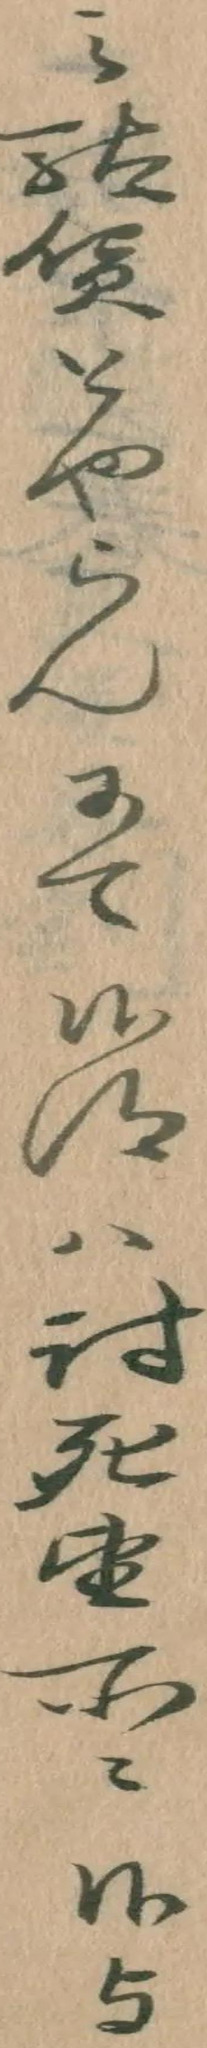之駄賃とやらん尓て候得は討死望所に候与
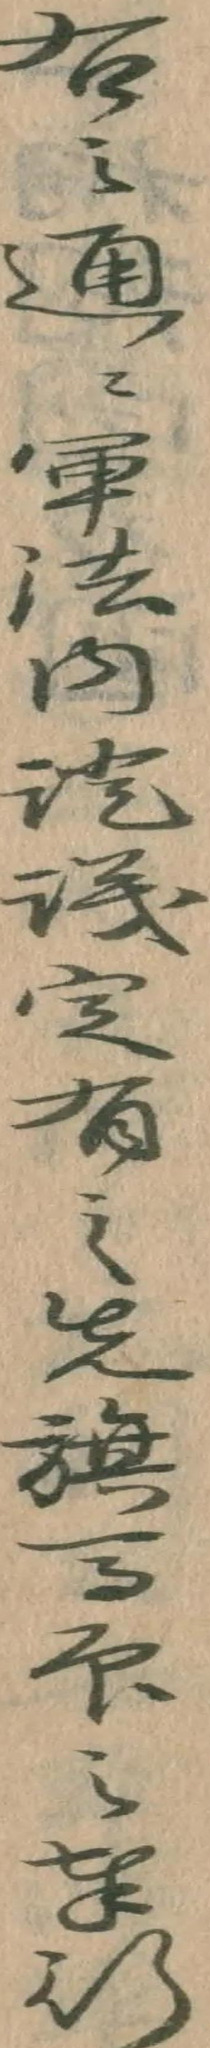右之通に軍法内證議定有之先旗馬印之奉行
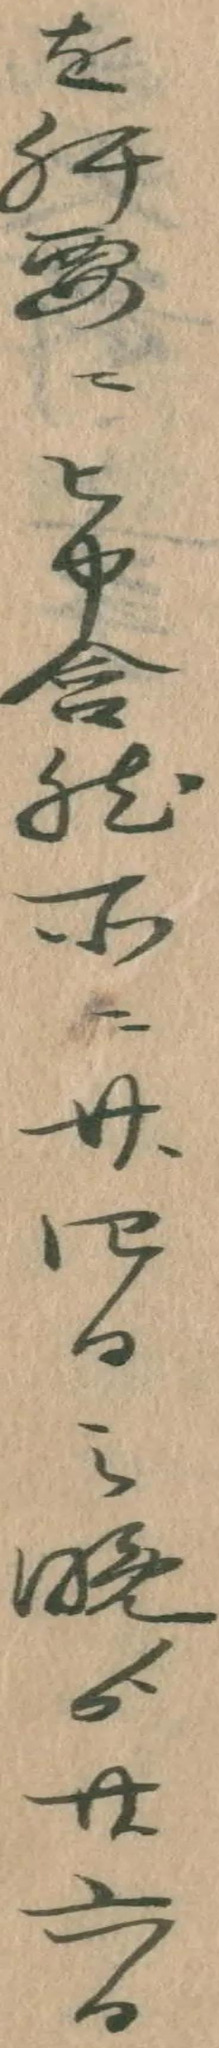を肝要に被申含然所に廿四日之晩ゟ廿六日
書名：切支丹御退治記 49巻. [7]
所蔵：国立国会図書館 National Diet Library, JAPAN
